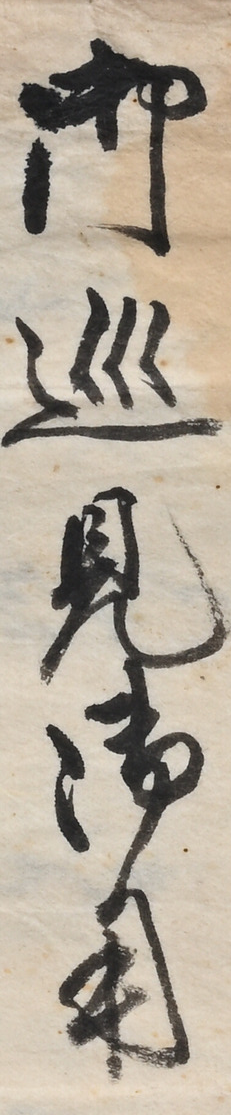御巡見御用
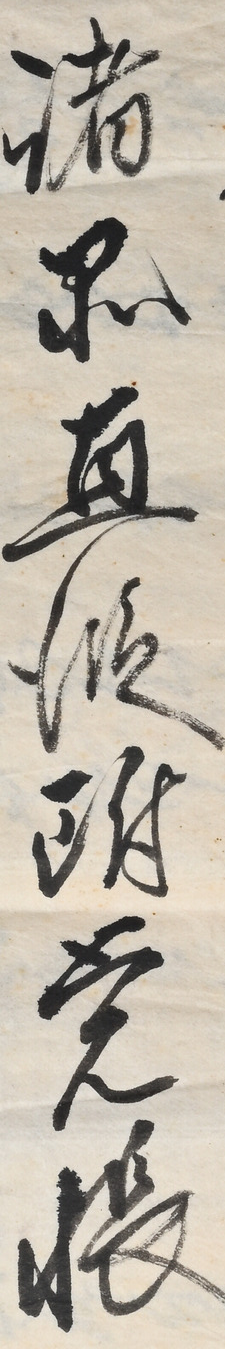諸品直段附覚帳
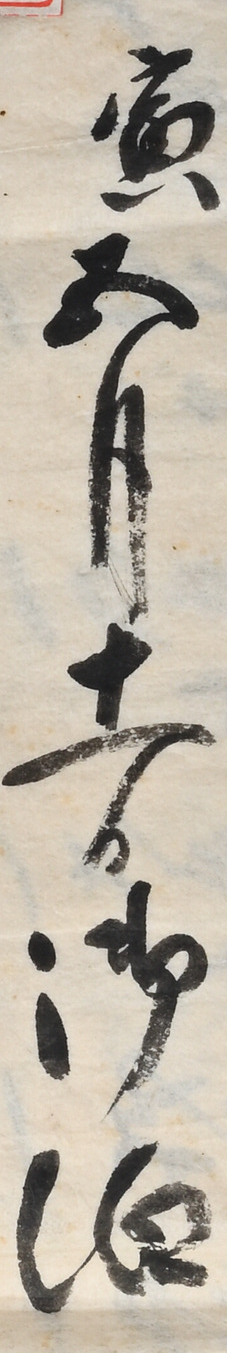寅五月十一日御泊

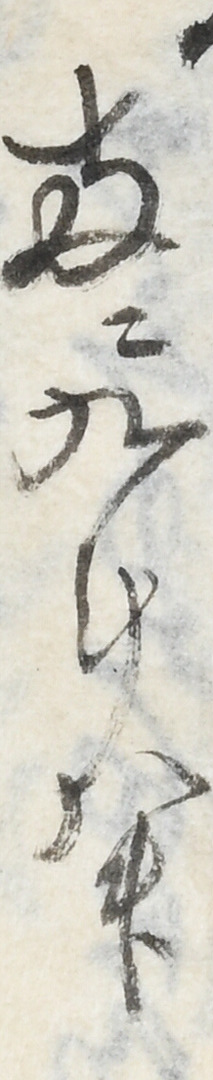両ニ九斗八升
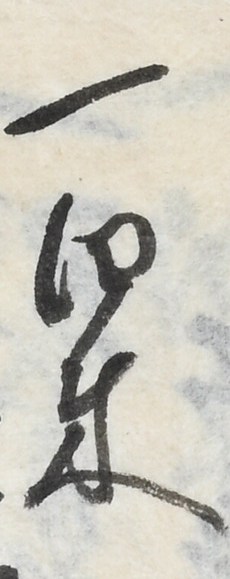一白米
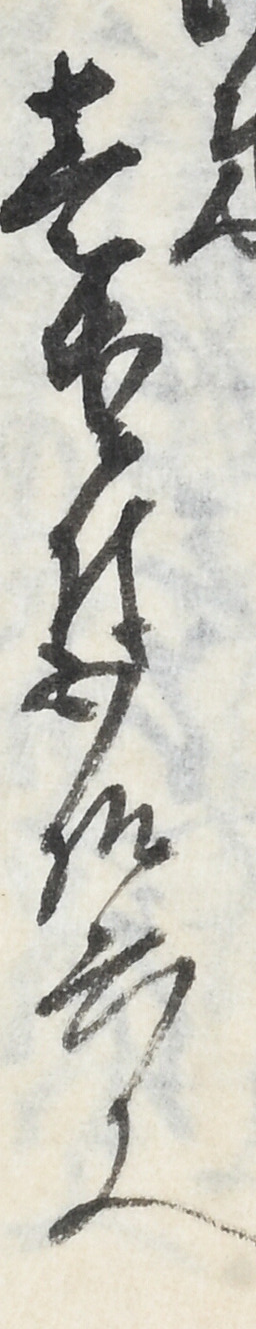壱升ニ付五拾六人
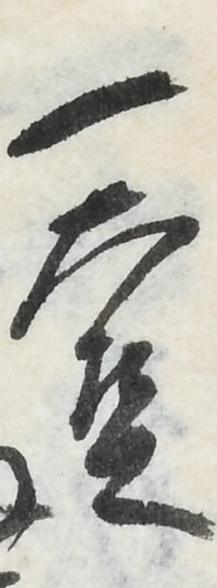一大豆
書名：御巡見御用諸品直段附覚帳
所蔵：伊那市立高遠町図書館・合同会社AMANE
